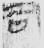司
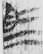馬
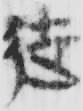徒
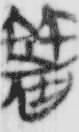箸（書）
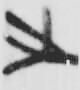之
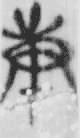庚
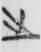之
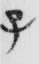子
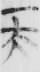夫一
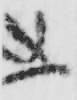之
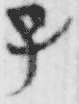子
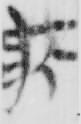疕
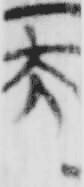夫一
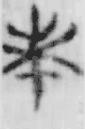未
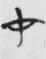才（在）
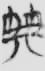典
